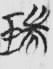瑞
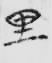里
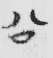公
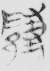○（隋）
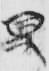○（得）
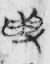受
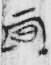○（期）
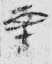辛
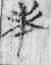未
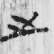之
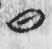日
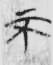不
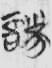○（察）
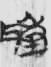○（陳）
